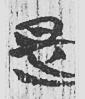是
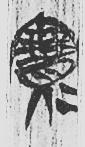賽=
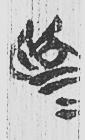爲=
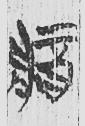𨟻
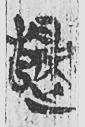歸
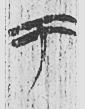于
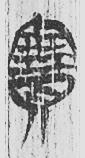賽
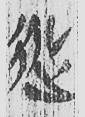{辶化}
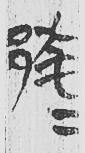○（蔡）
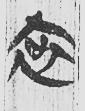哀
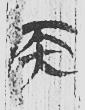侯
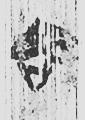命
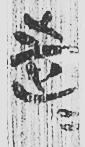{之止}
